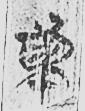{木𦥑}
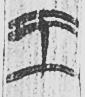王
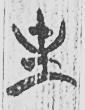生
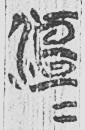洹=
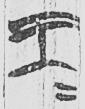王=
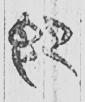即
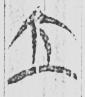立
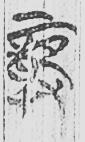{龍廾}
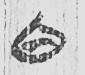白
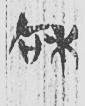和
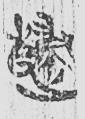歸
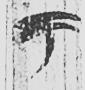于
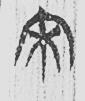宋
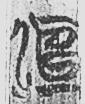洹
